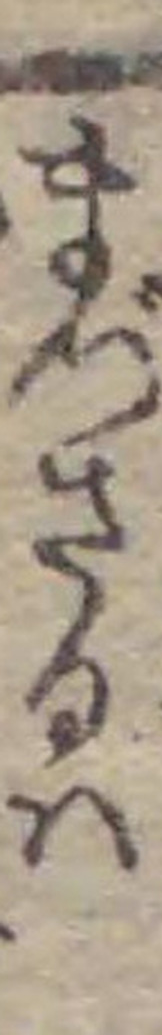まづさるは
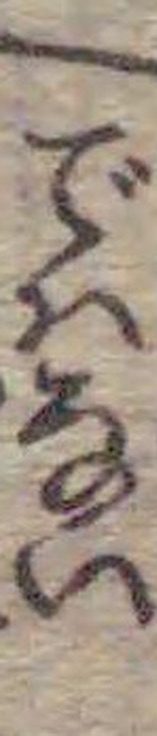ではない
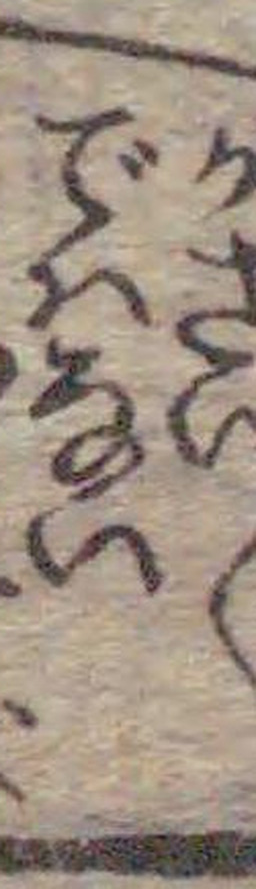ではない
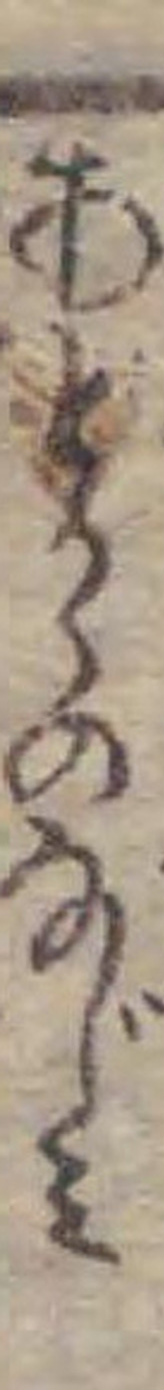あとからのなじみ
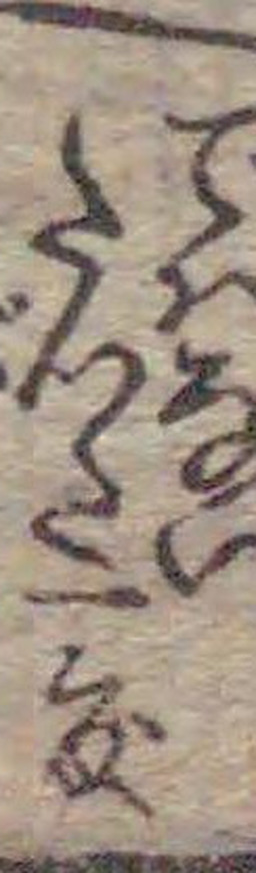たつた一度
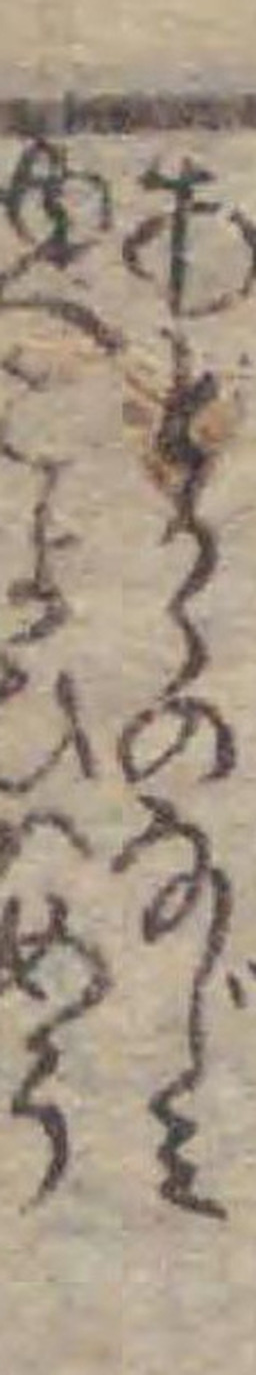ゆへこよひはめう
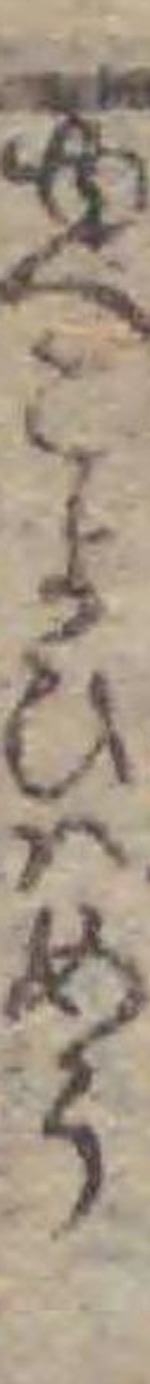ゆへこよひはめう
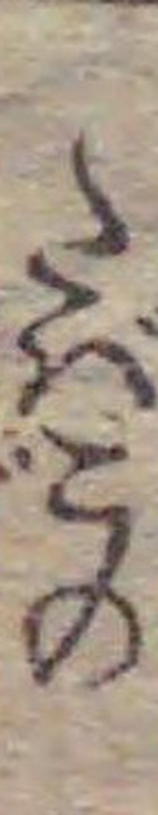たばこの
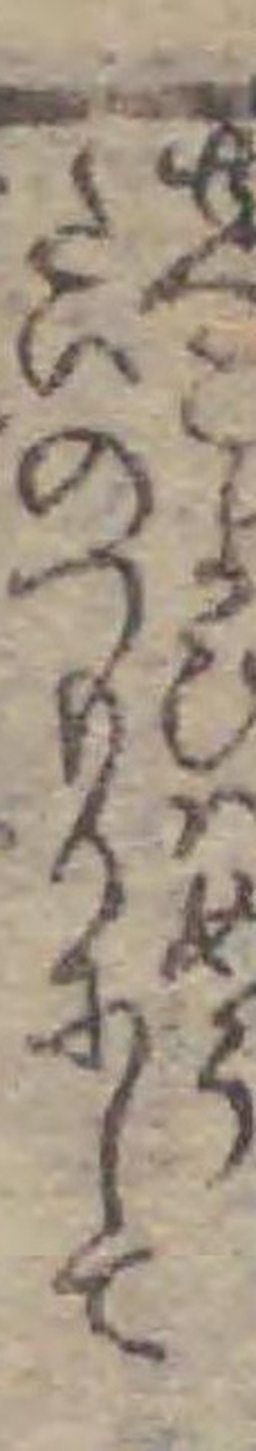たいのつもりにして
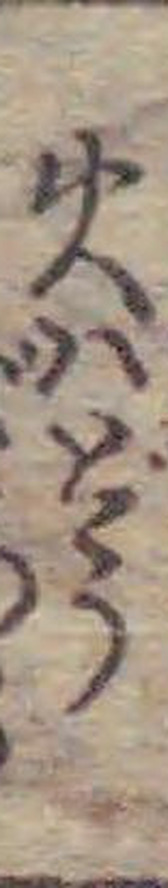火はどう
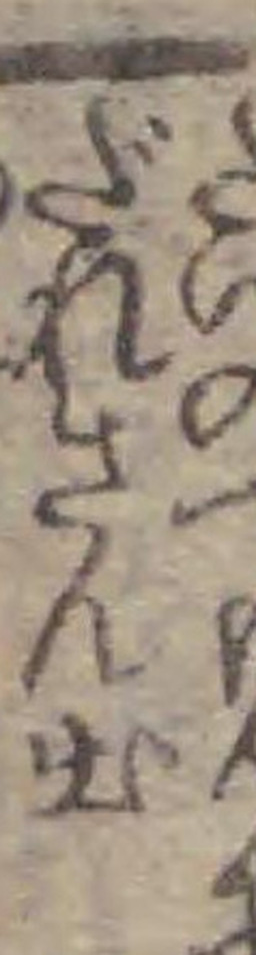だれさん出
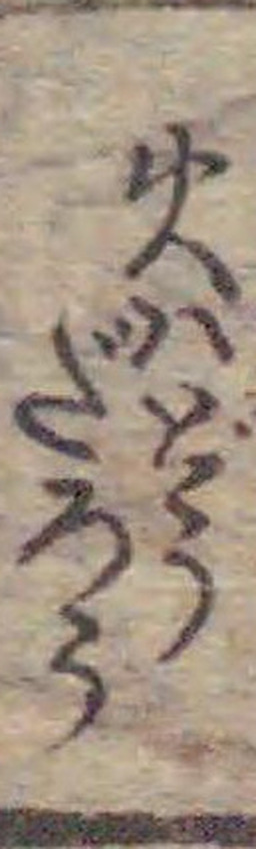だろう
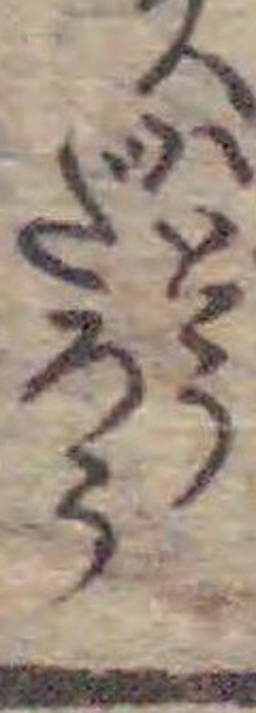だろう
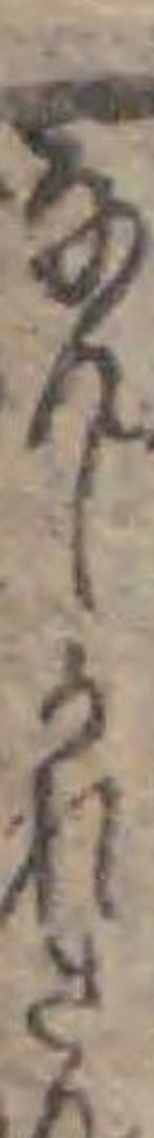なんしかれさん
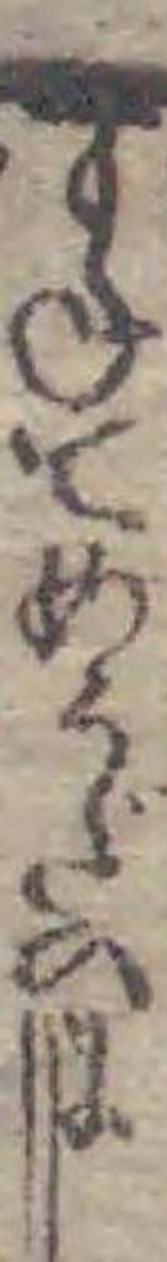すねてめうだいに
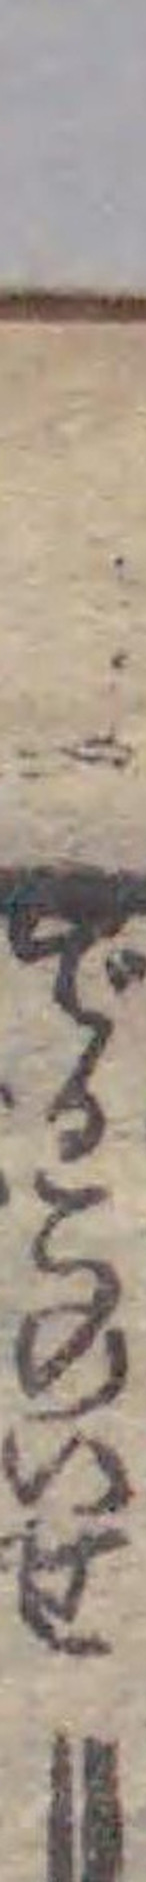でるこのいせ
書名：竜宮苦界玉手箱 : 3巻
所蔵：国立国会図書館 National Diet Library, JAPAN
